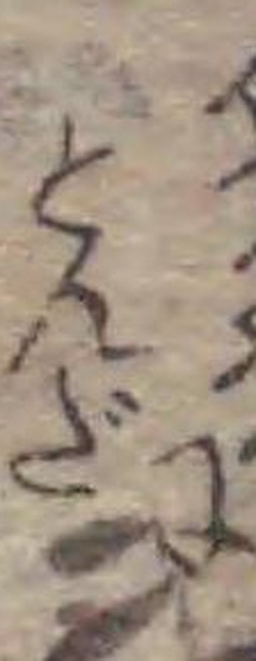とんだ
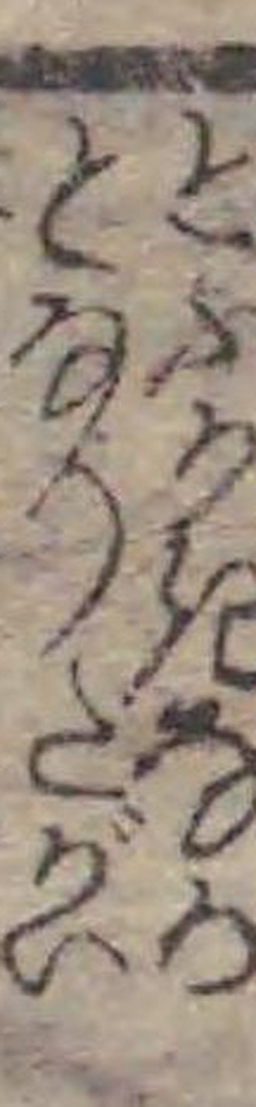となりたがい
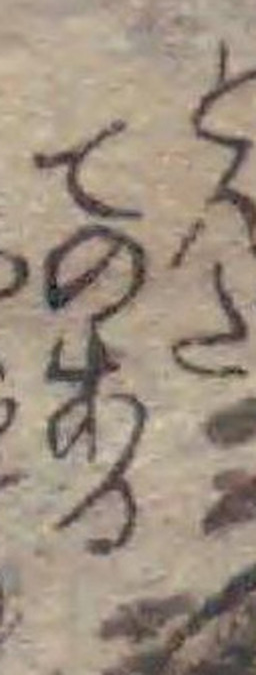てのある
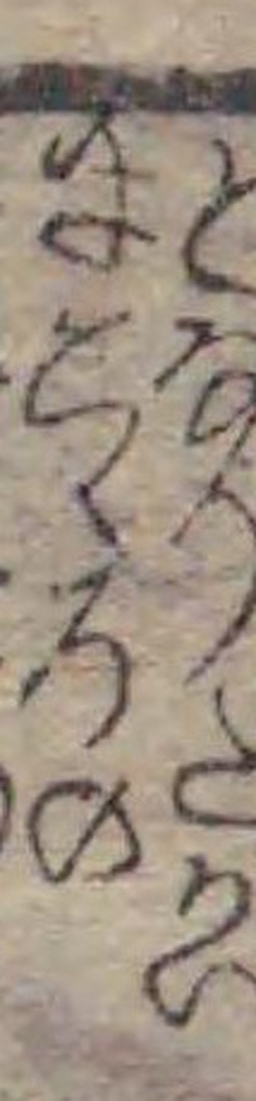にこゝろの
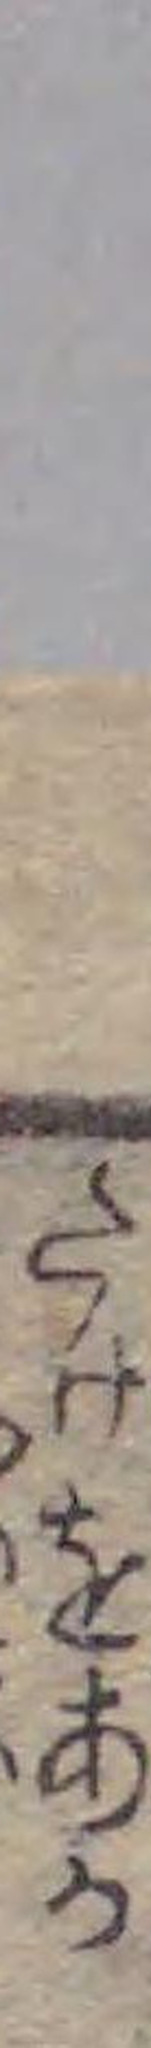たけをあか
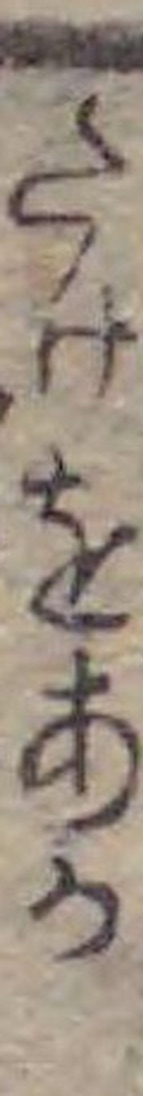たけをあか
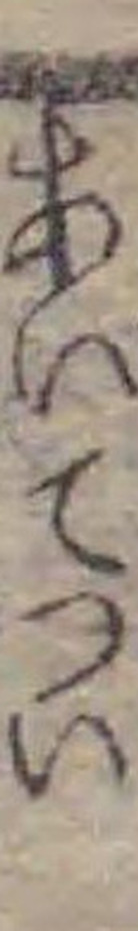あいてつい
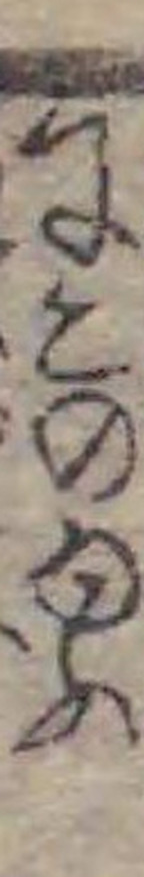にこのゆふ
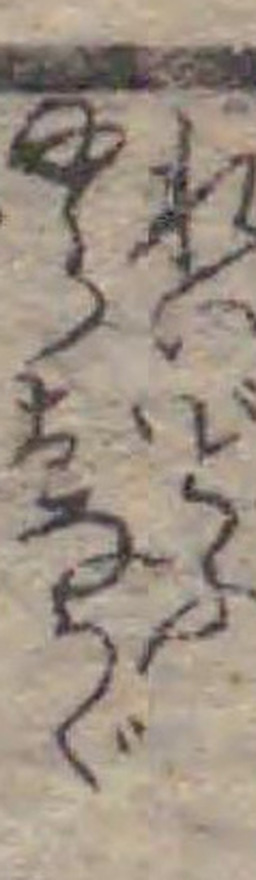やらおなかゞ
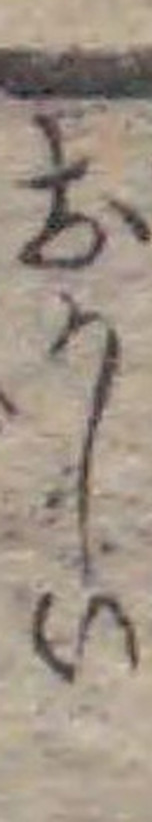おかしい
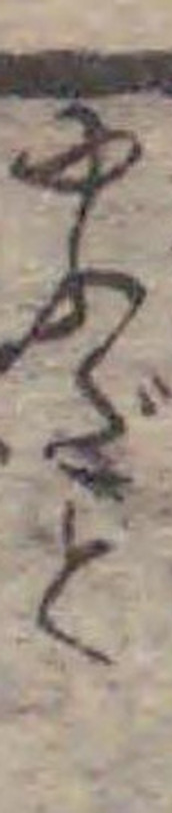やふだと
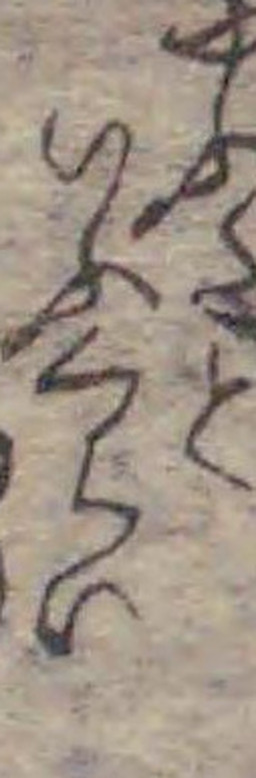いふくらい
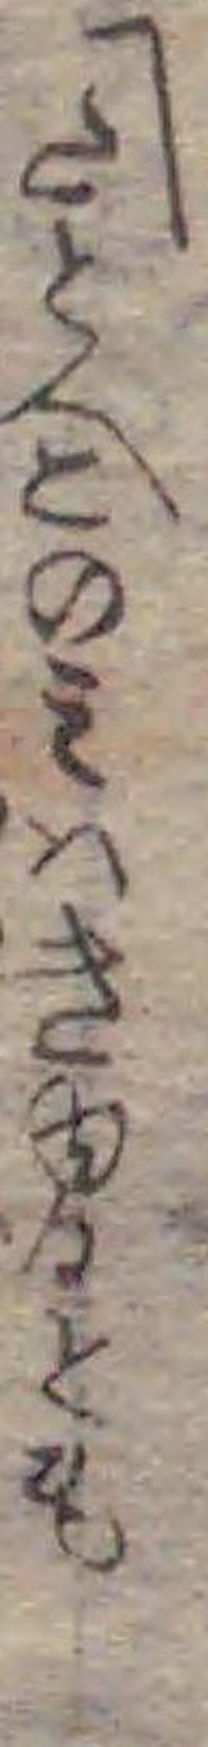〽たとへこのみはきゆるとも
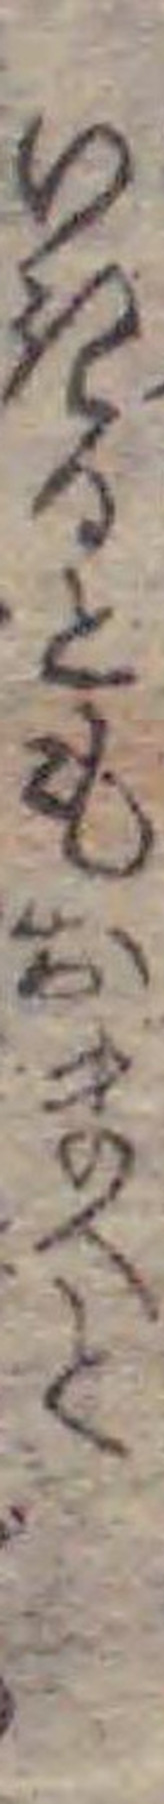いきるともおまへと
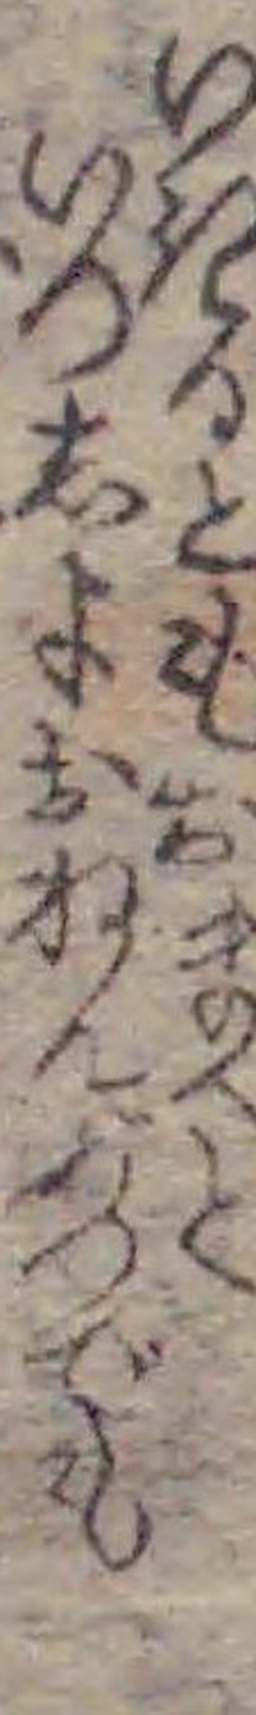いつしよおねんぶつでも
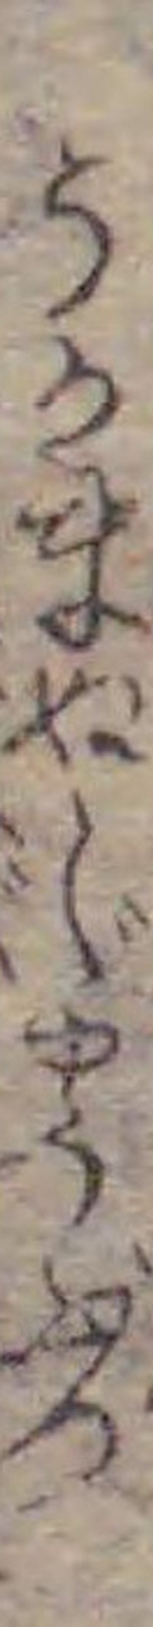うかまぬじやうぶつ
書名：化物見越松 : 2巻
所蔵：国立国会図書館 National Diet Library, JAPAN
